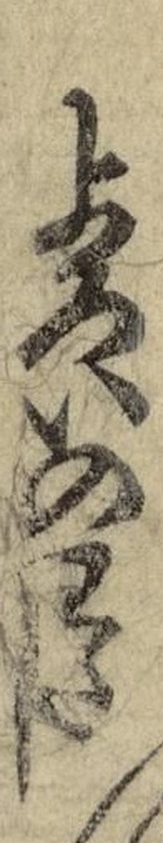よろいのわたし
